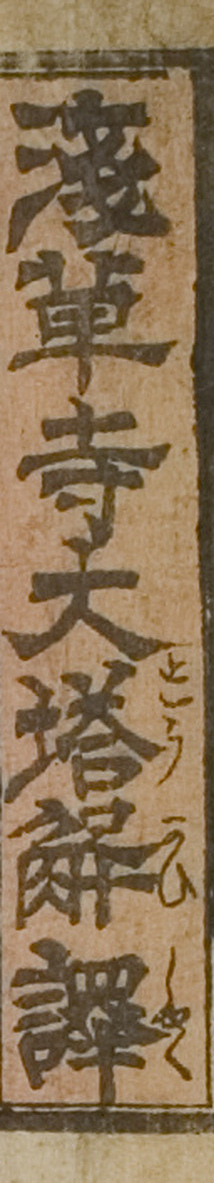浅草寺大塔解訳
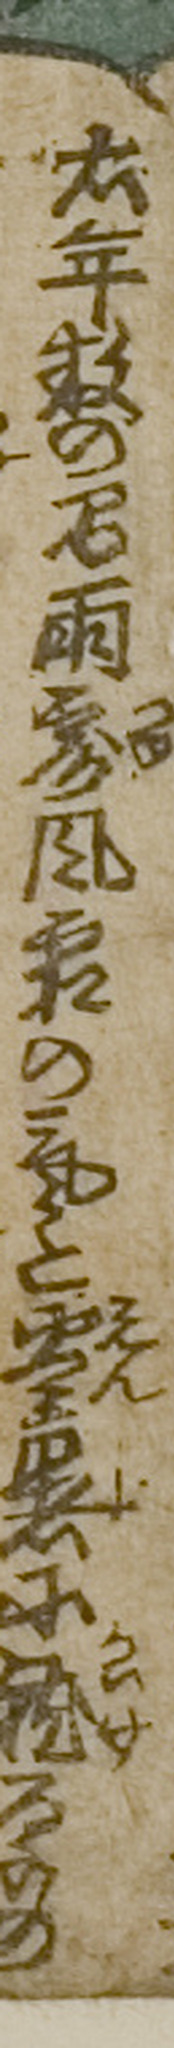右年数の間雨露風霜の気と炎暑に乾るもの
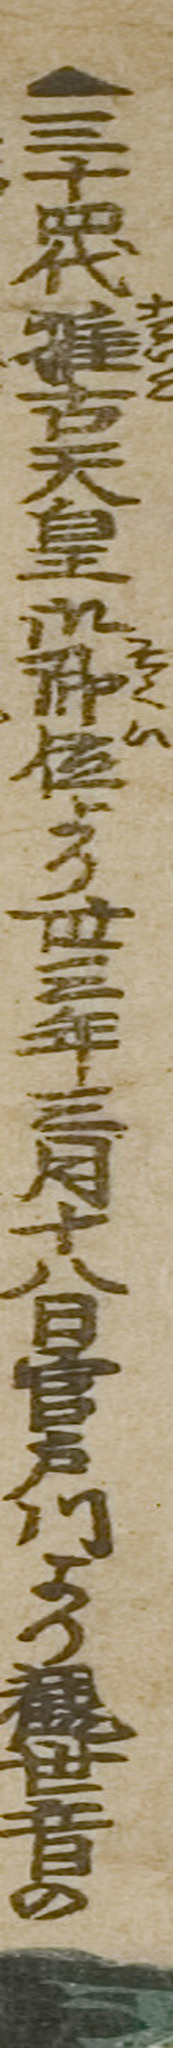▲三十四代推古天皇御即位より丗三年三月十八日宮戸川より観世音の
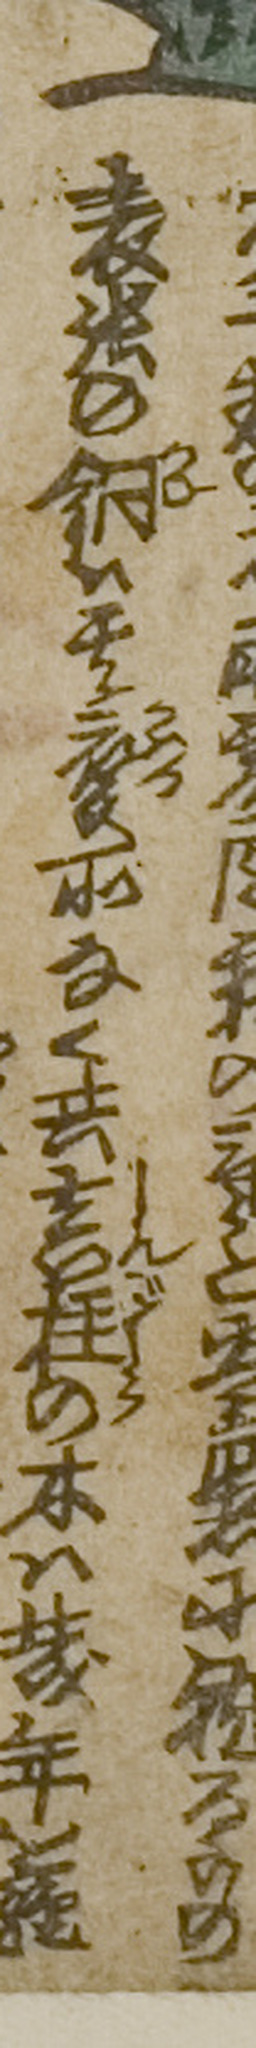表張の銅は其変所なく共真柱の木は幾年を経
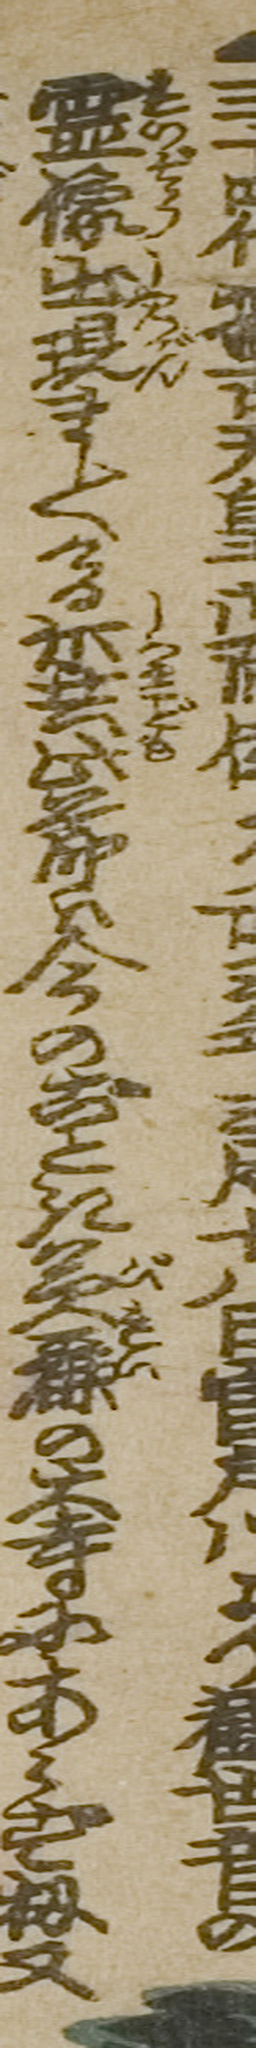霊像出現まし〳〵ける爾共此節は今のごとき美麗の大寺にあらず扨又
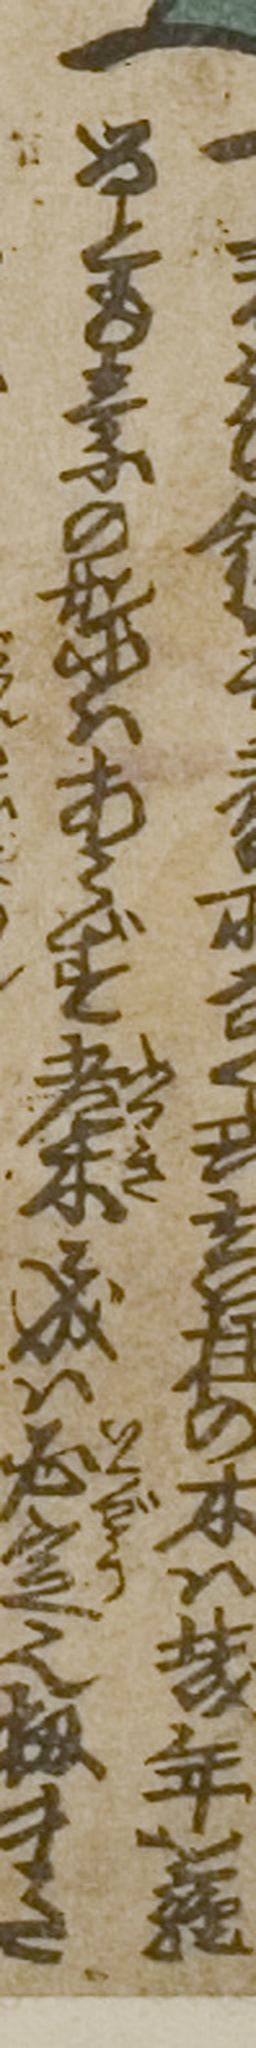るとも素の如にはあらず老木に成は必定也扨また
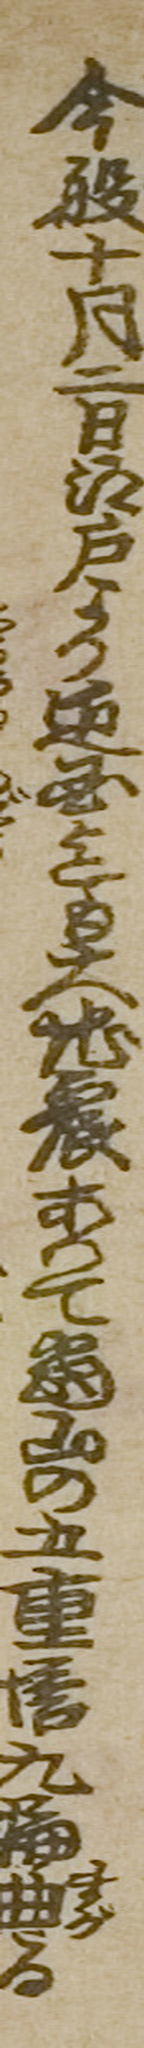今般十月二日江戸より近国迄も大地震ありて当山の五重塔九輪曲る
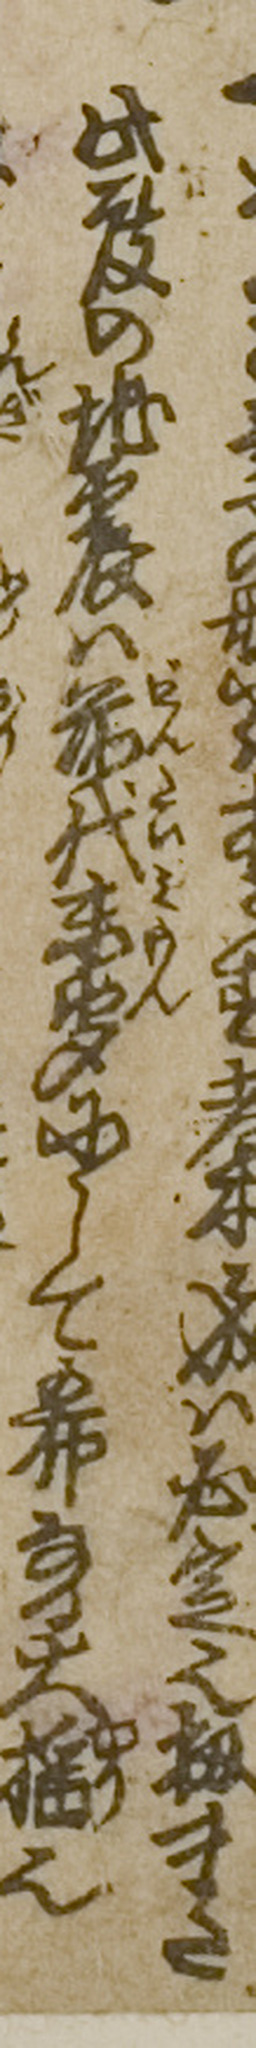此度の地震は前代未聞にして希なる大揺也
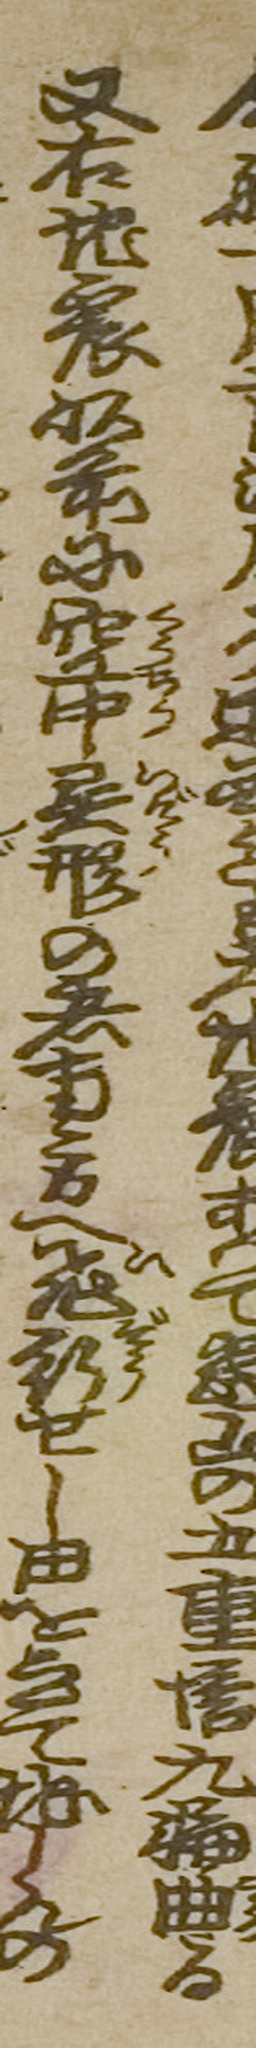又右地震以前に空中異形の者南方へ飛行せし由を云て地しんの
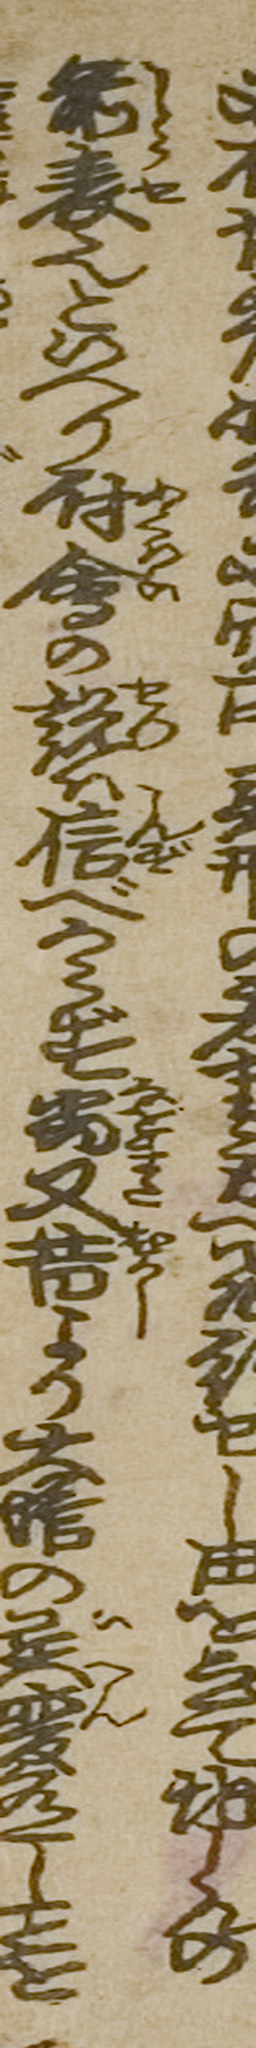前表也といへり付会の説は信へからず尚又昔より大塔の異変有しことを
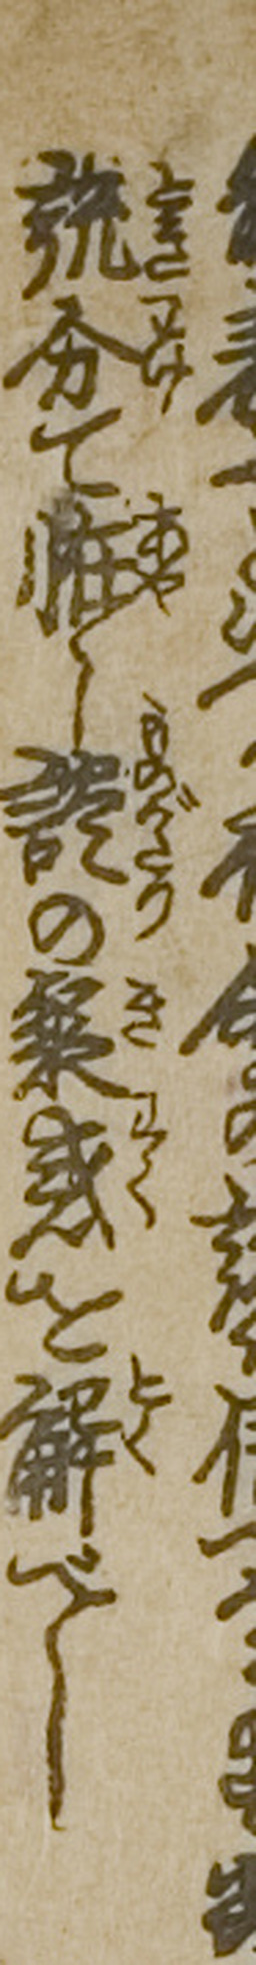説分て怪し談の惑を解べし
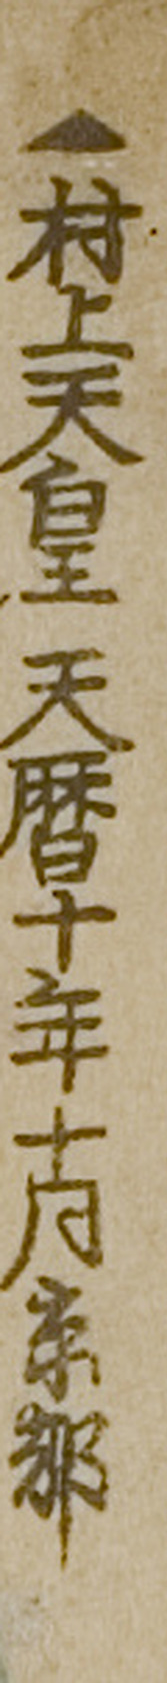▲村上天皇天暦十年十月京都
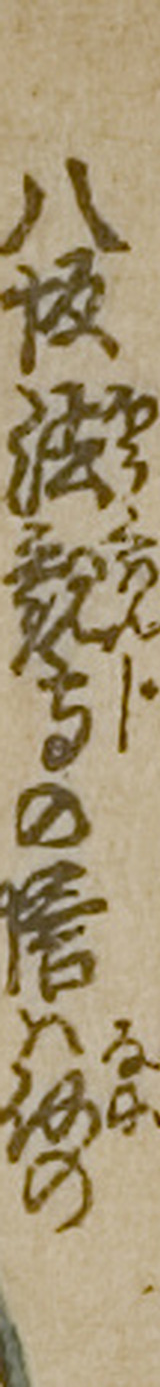八坂法観寺の塔は何の
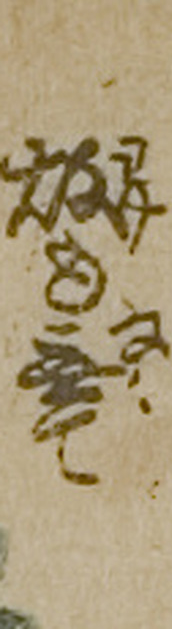訳も無て
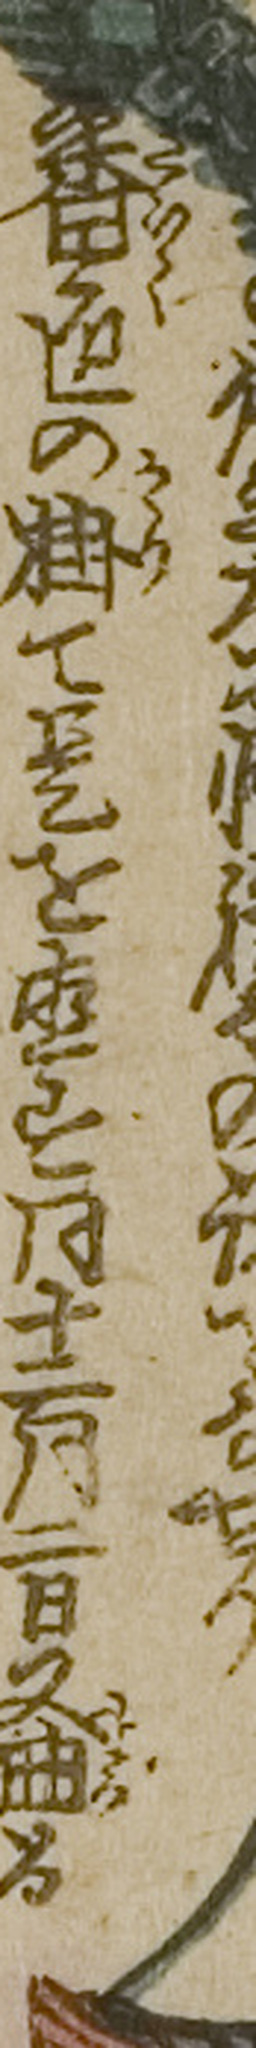番匠の掛て是を直す同十二月二日又曲る
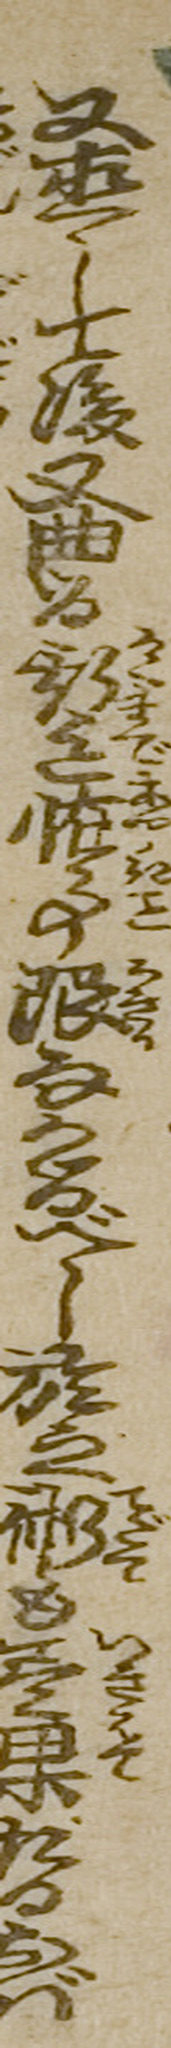又直して後又曲る斯迄怪事限なかるべし於之術も尽果たるおば
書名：浅草寺大塔解釈
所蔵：東京大学総合図書館 General Library in the University of Tokyo, JAPAN
